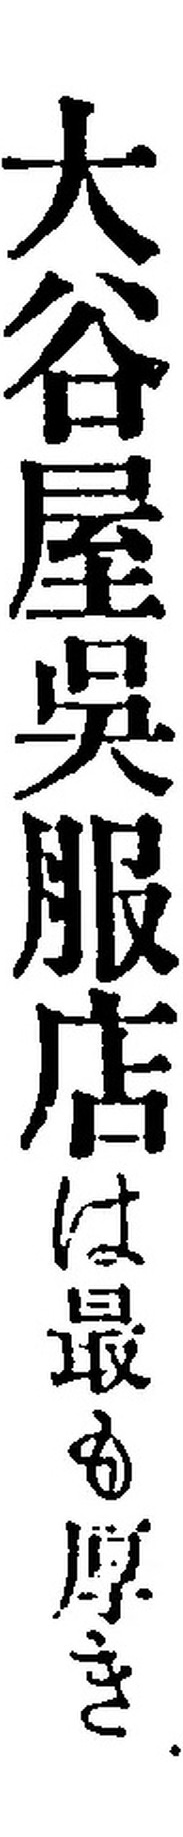大谷屋呉服店は最も厚き
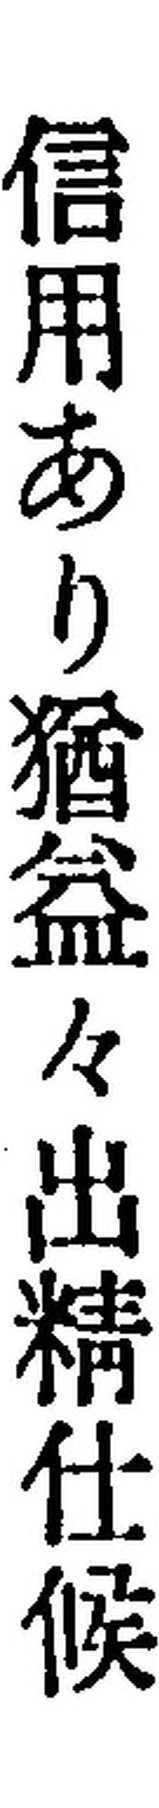信用あり猶益々出精仕候
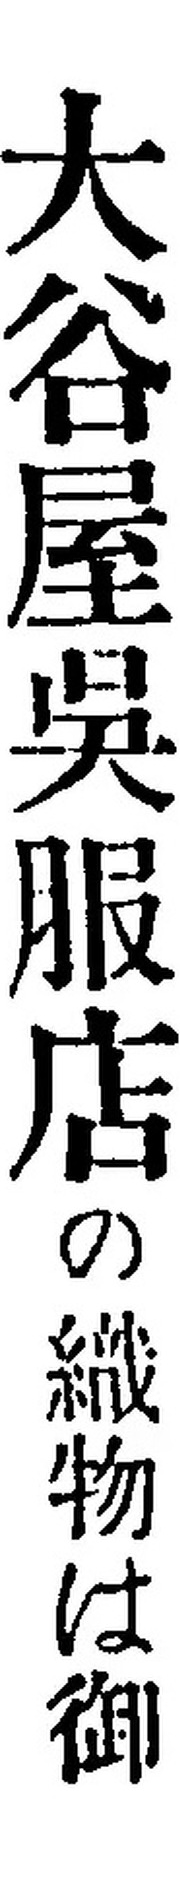大谷屋呉服店の織物は御
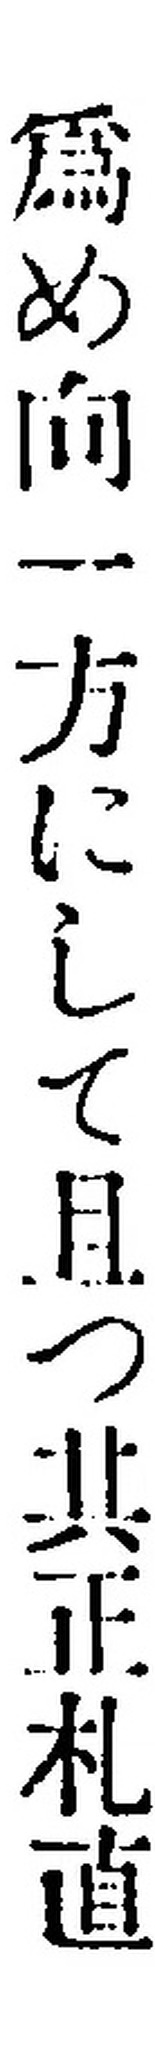為め向一方にして且つ其正札値
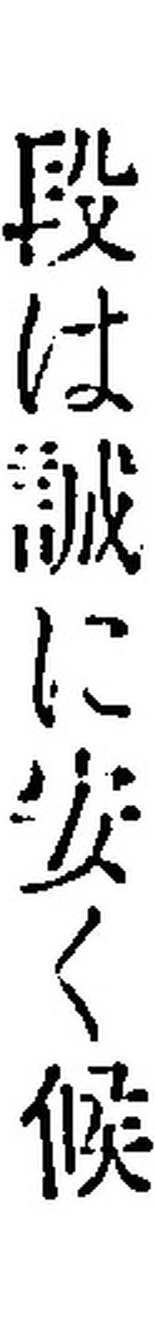段は誠に安く候
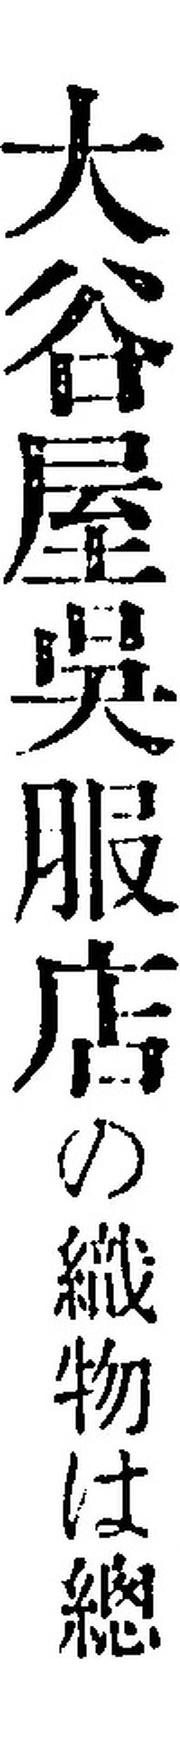大谷屋呉服店の織物は御
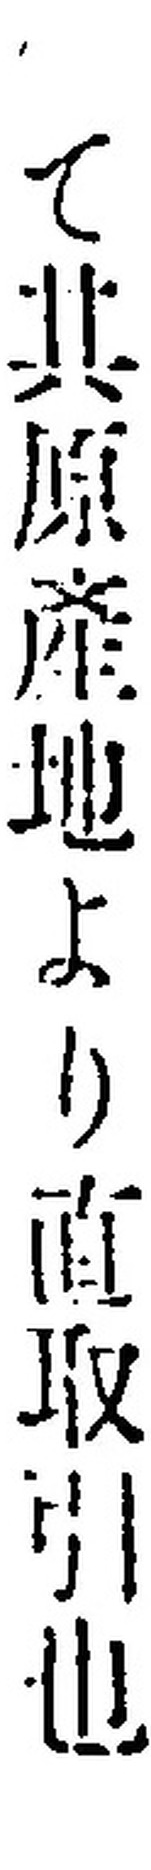て其原産地より直取引也
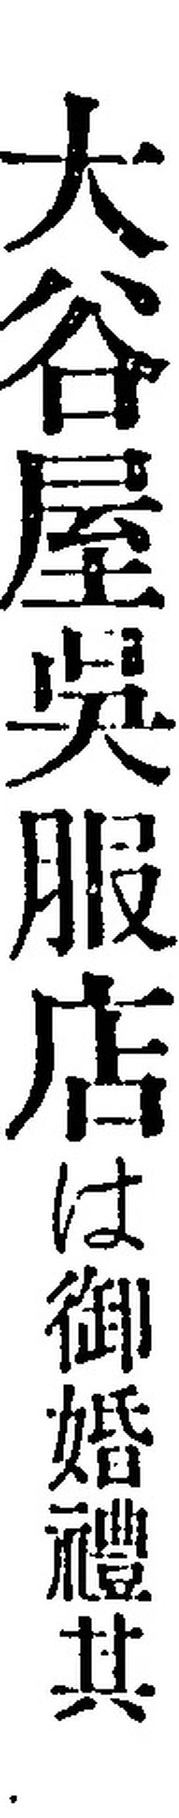大谷屋呉服店は御婚礼其
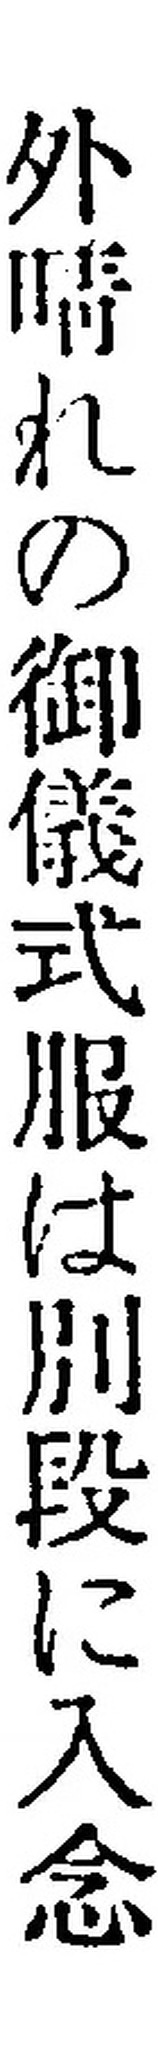外晴れの御儀式服は別段に入念
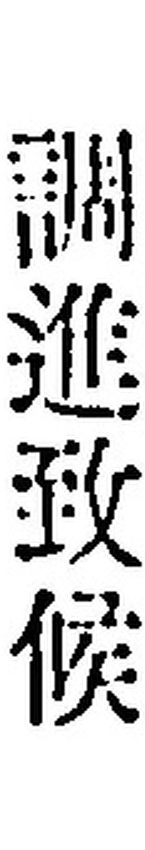調進致候
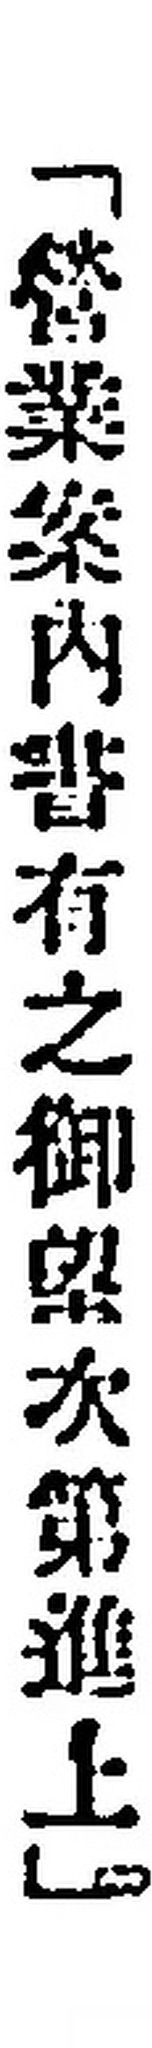「営業案内書有之御望次第進上」

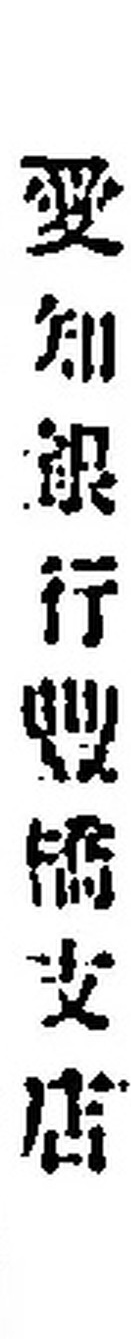愛知銀行豐橋支店
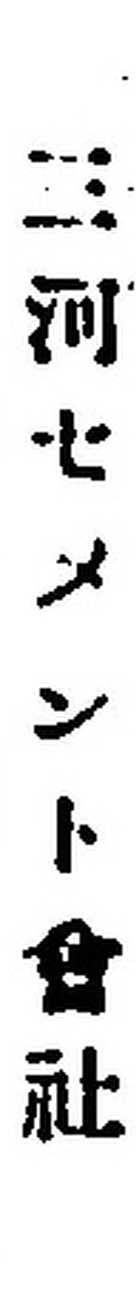三河セメント會社
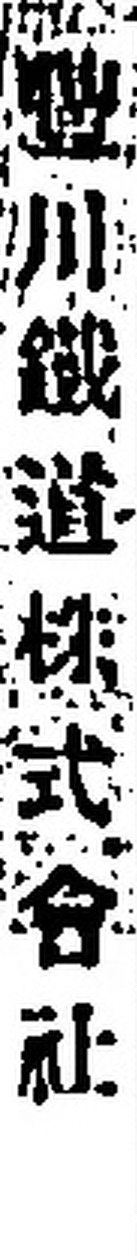豐川鐡道株式會社

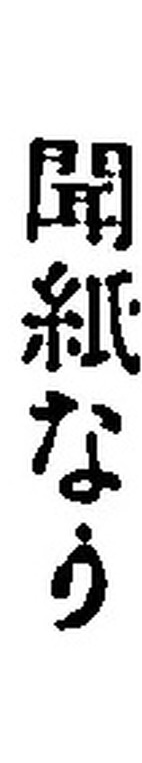聞紙なり
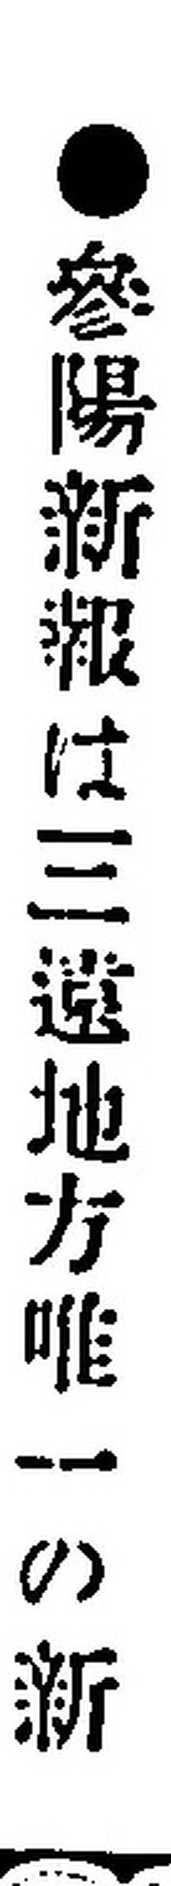●参陽新報は三遠地方唯一の新
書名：東参名勝案内
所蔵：国立国会図書館 National Diet Library, JAPAN
